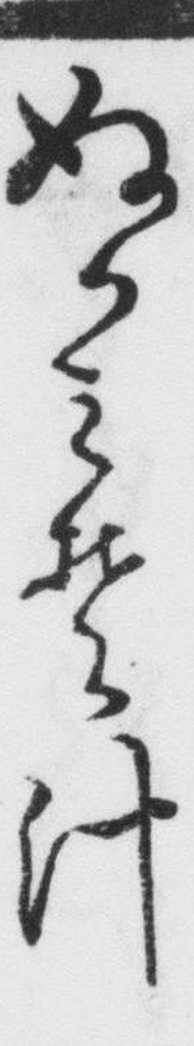ぬかみそ汁
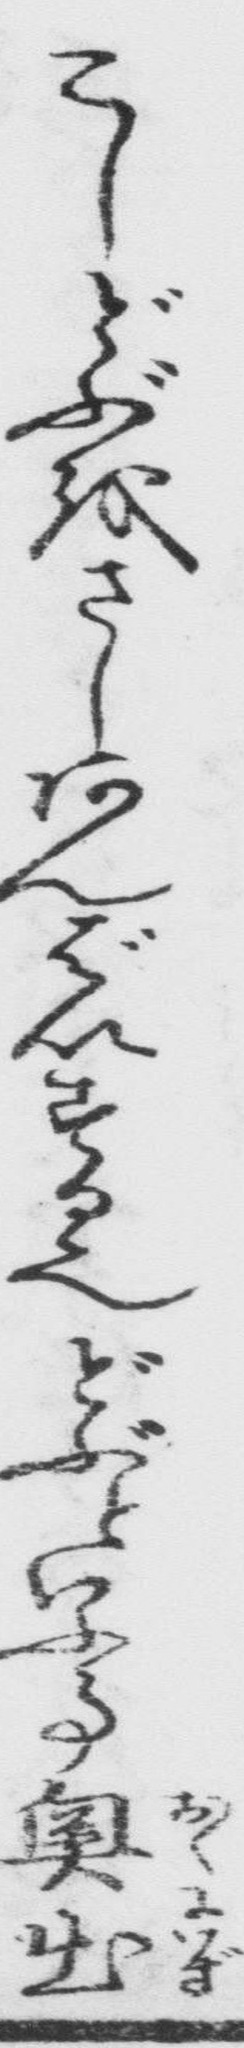こしどぶをさしあんばいする也こしどぶといふ事奥出
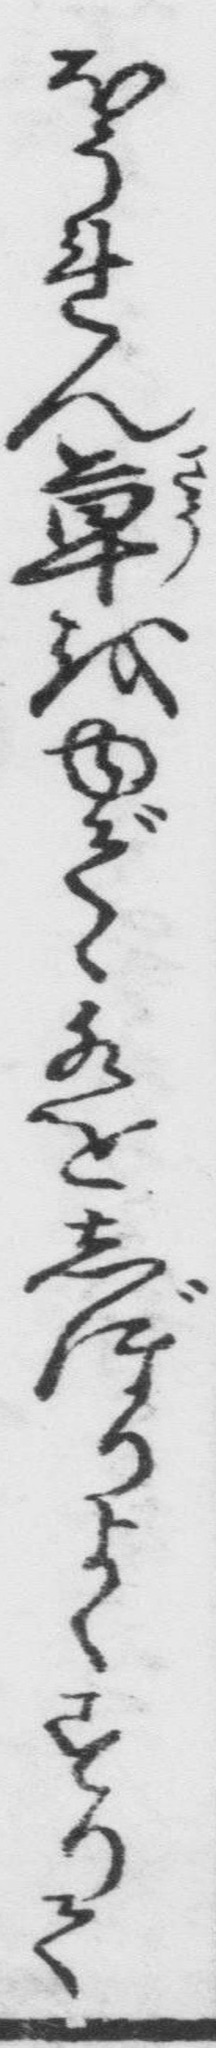ほうれん草をゆでゝ水をしぼりよくすりて
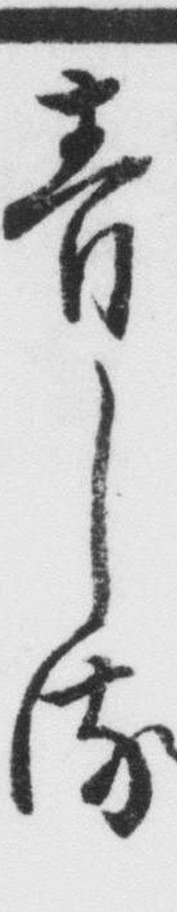青しる
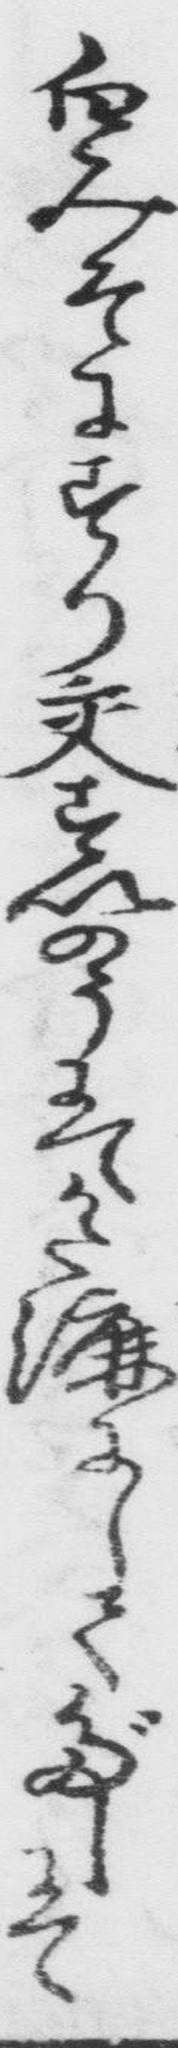白みそにすり交すいのうにてかた漉にしてだしにて
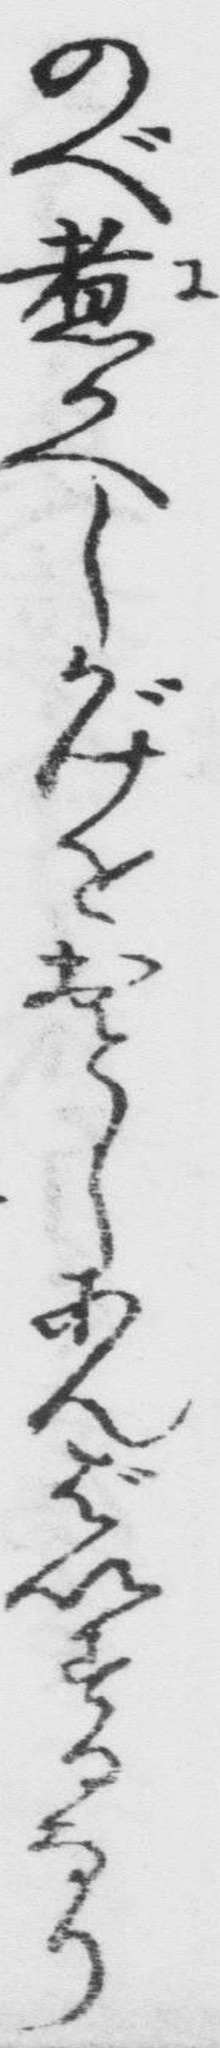のべ煮かへしかげをおとしあんばいするなり
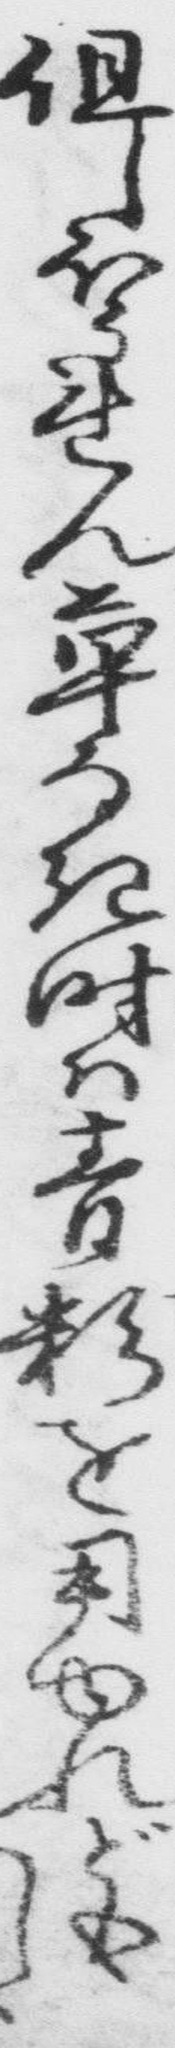但しほうれん草なき時は青粉を用ゆれどもあし
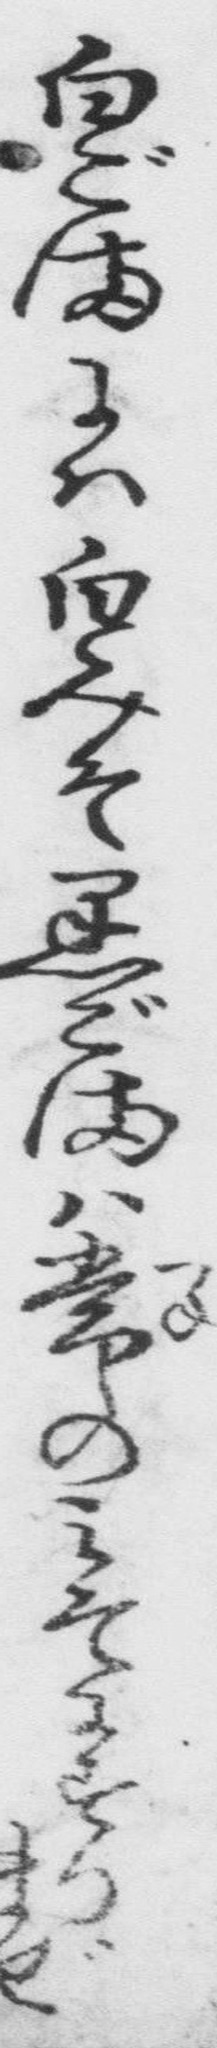白ごまには白みそ黒ごまは常のみそすりまぜ
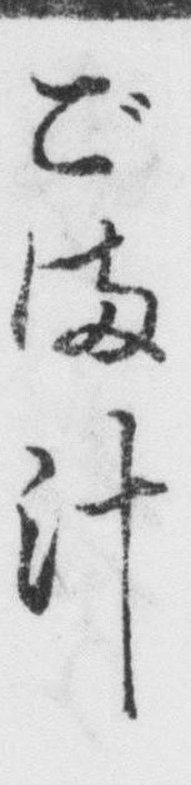ごま汁
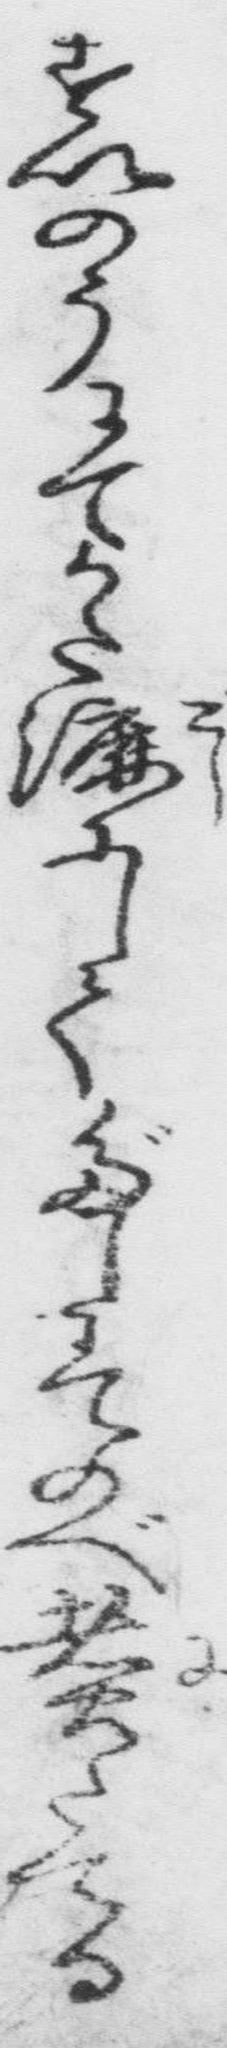すいのうにてかた漉にしてだしにてのべ煮たてる

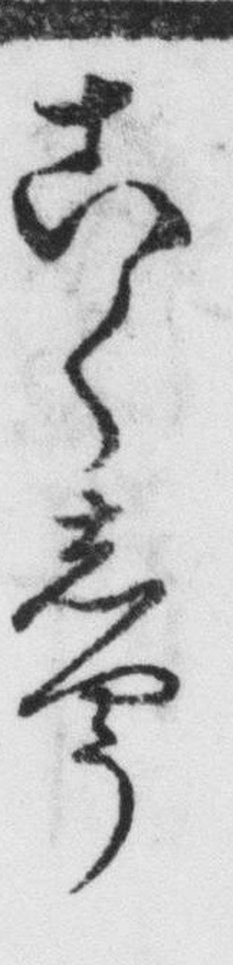こくしやう
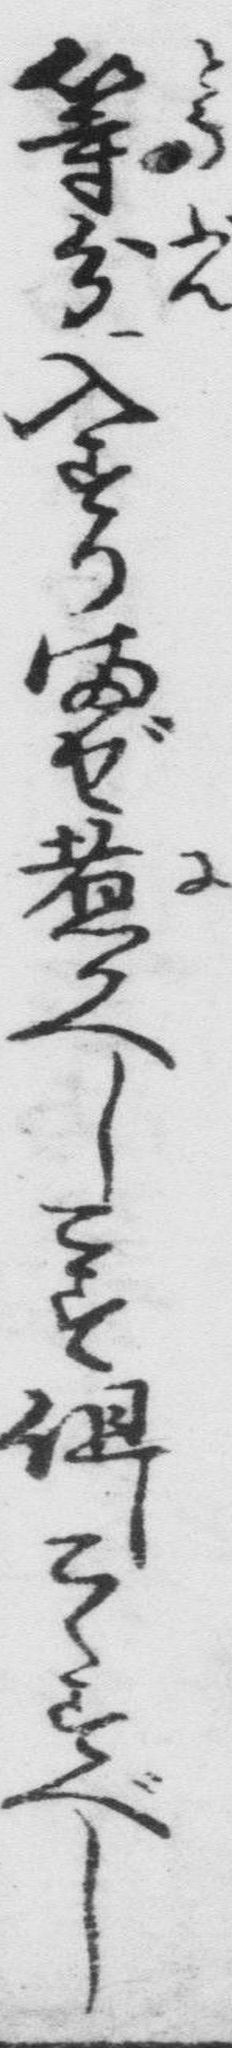等分入すりまぜ煮かへしこす但しこくすべし
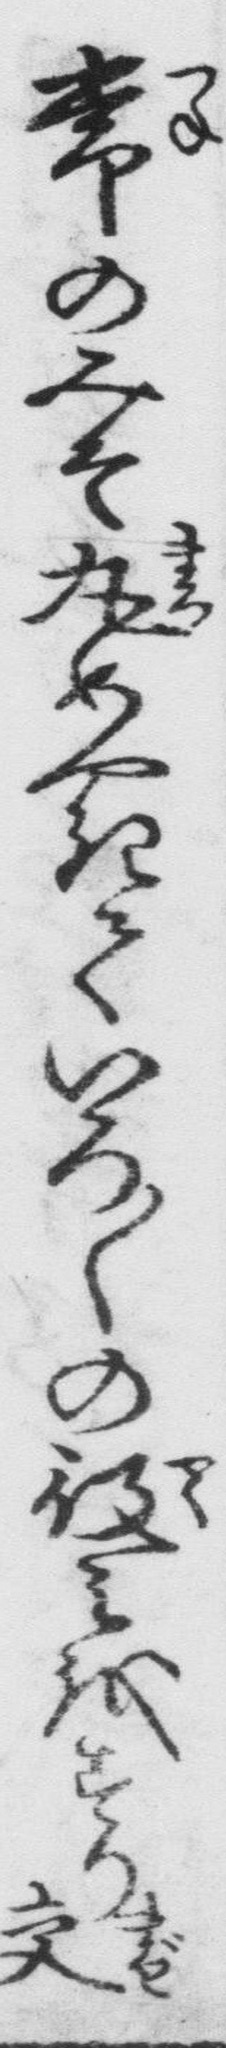常のみそ丸めやきていろ〳〵の役みをすり交
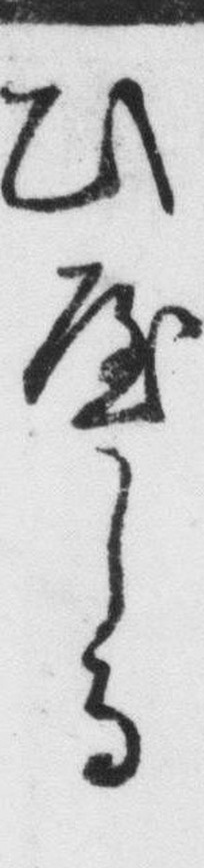ひやしる
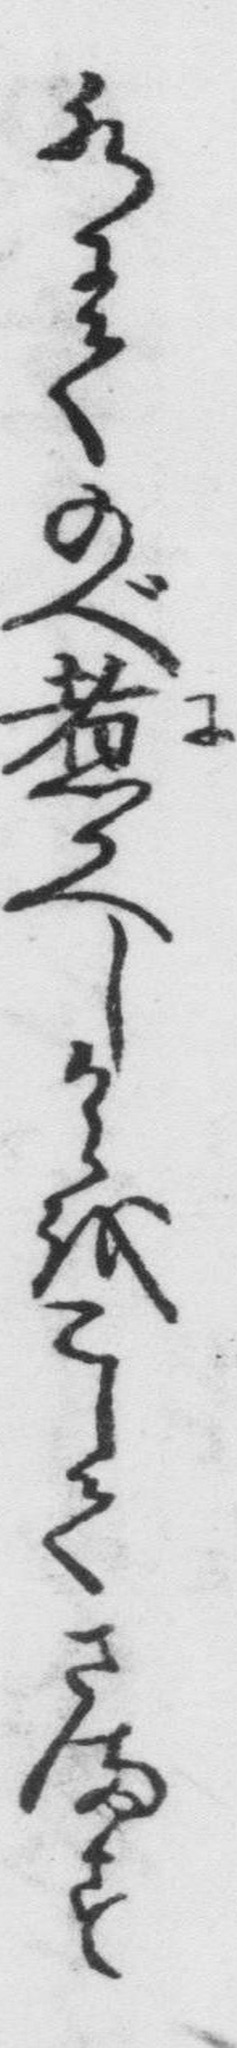水にてのべ煮かへしからをこしてさます
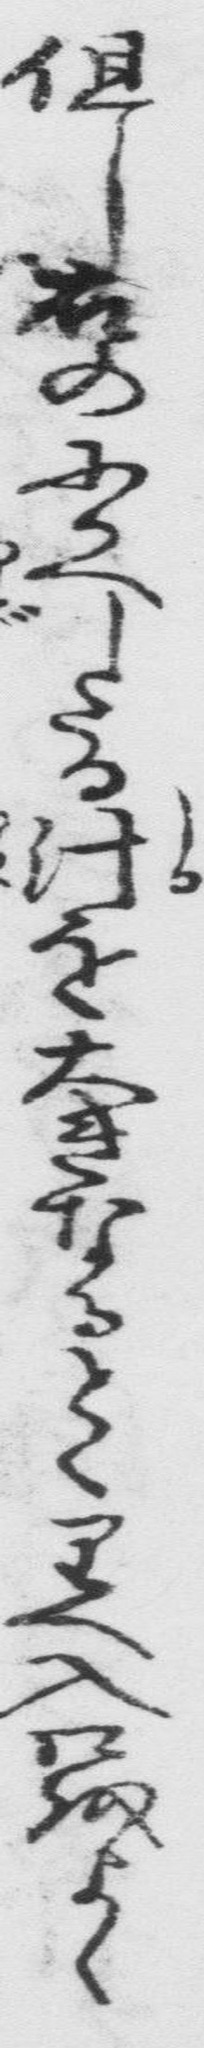但し右のにかへしたる汁を大きなるとくりへ入口をよく
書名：料理早指南
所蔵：大阪府立大学学術情報センター 国文学研究資料館
